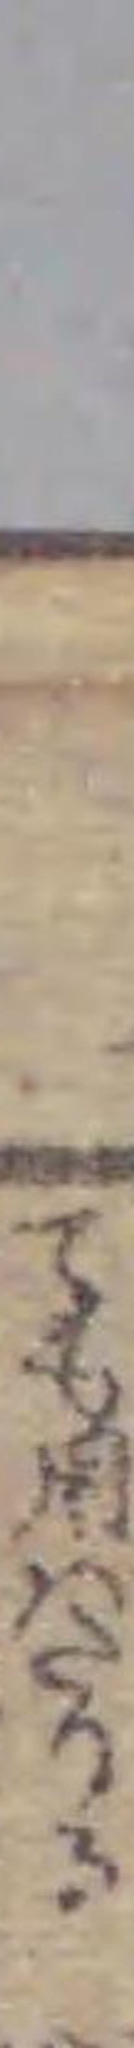ても用はたりる
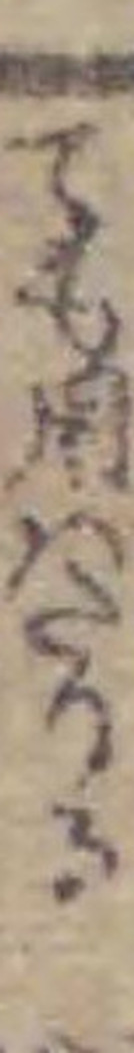ても用はたりる
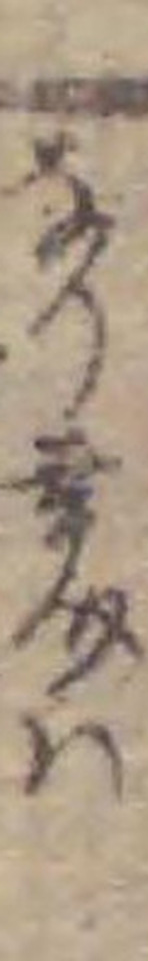なり幸介は
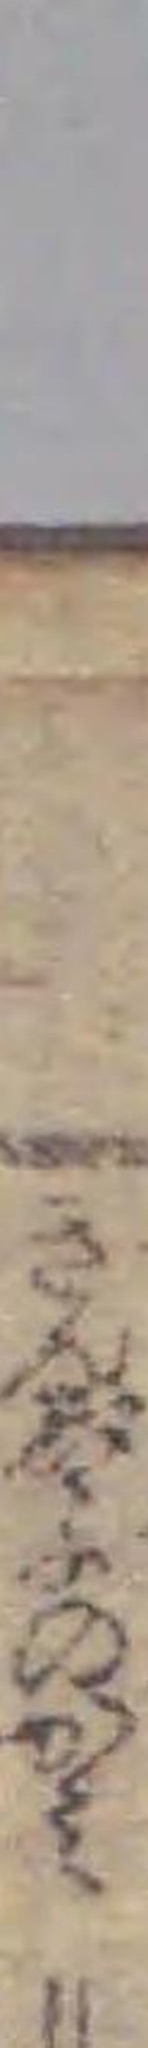きんじよのかみ
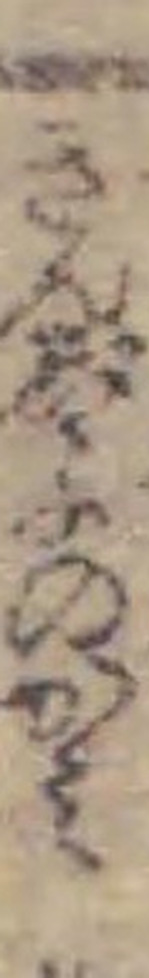きんじよのかみ
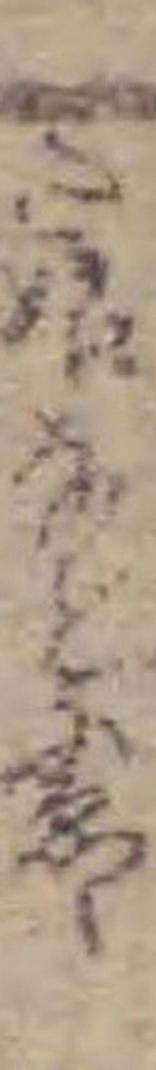た娘などにゑゝ
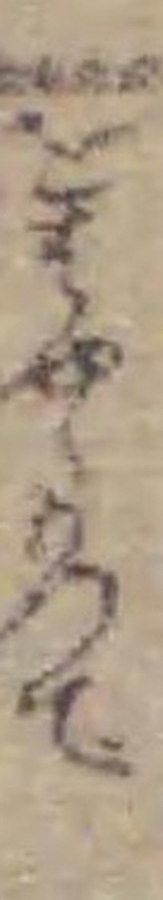をはやくもつて
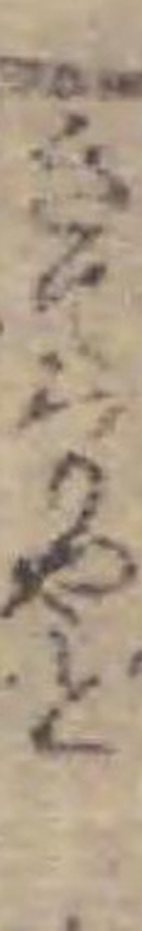きてくりやと
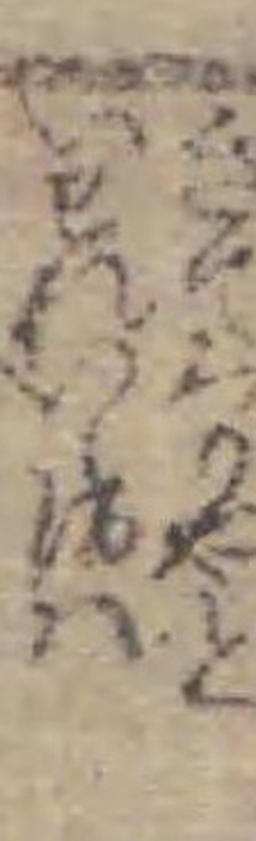いわれいゝ酒は
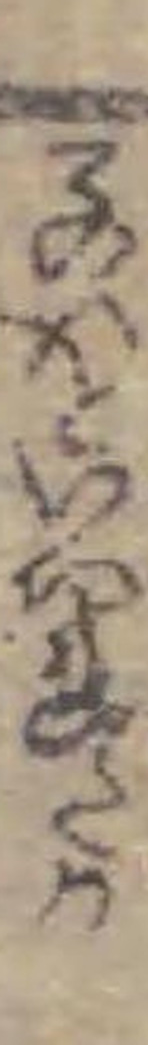子はといはれたか
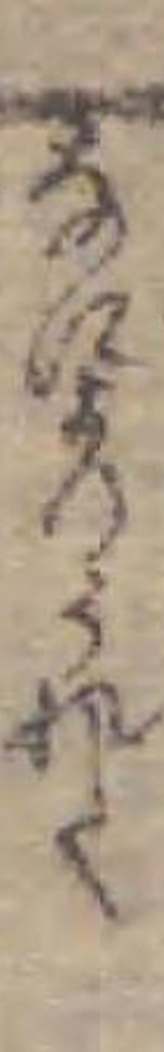なによりうれしく
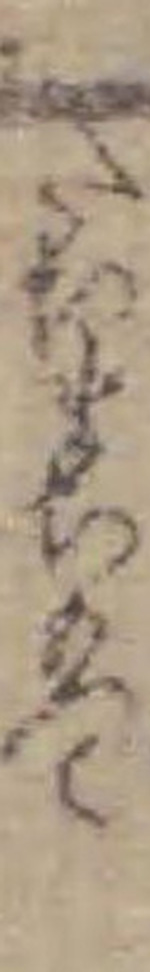たちまちもつて
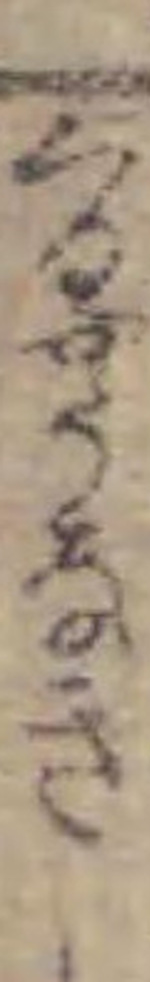くるやうなき
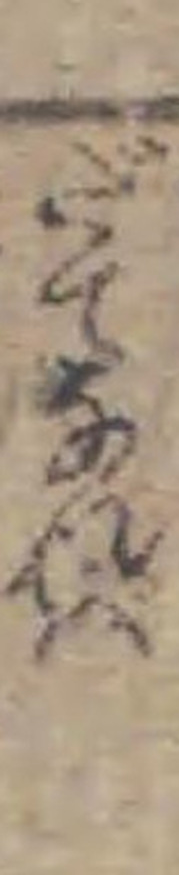だてなれは
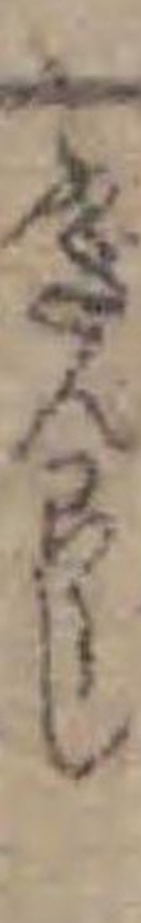ふだんわし
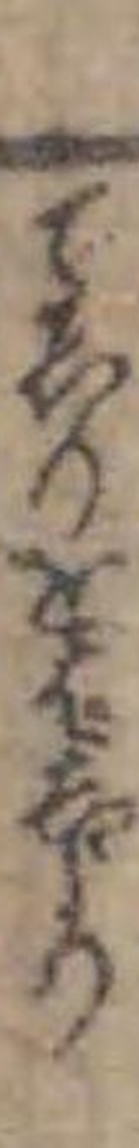てしりをはしより
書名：通風伊勢物語 : 3巻
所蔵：国立国会図書館 National Diet Library, JAPAN
